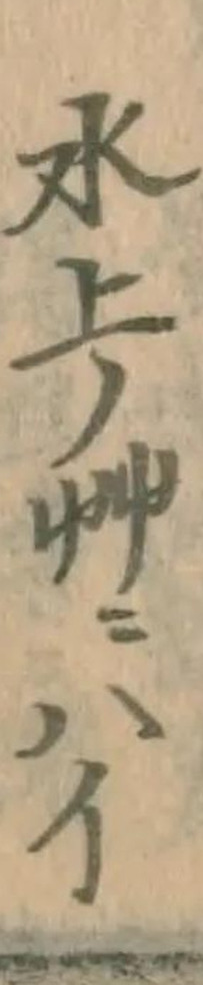水上ノ艸ニハイ
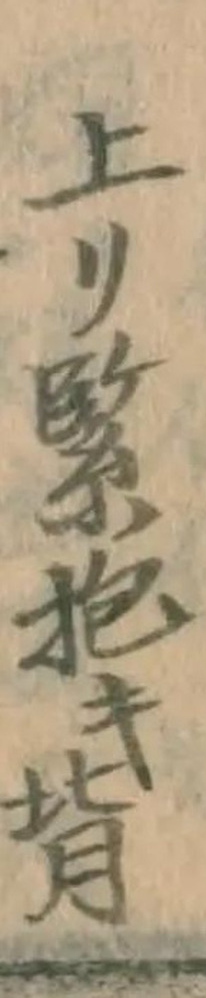上リ緊抱キ背
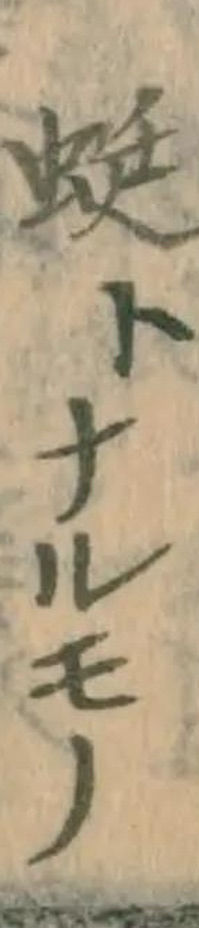蜓トナルモノ
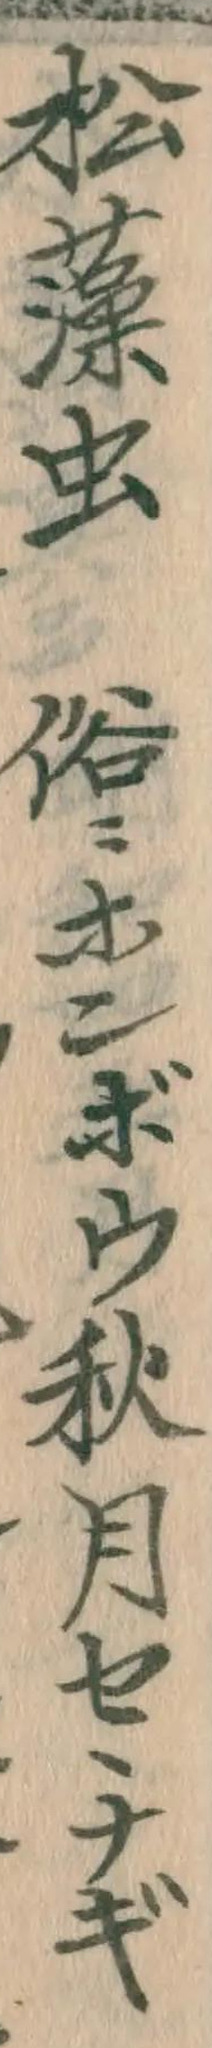松藻虫俗ニホンボウ秋月セヽナギ
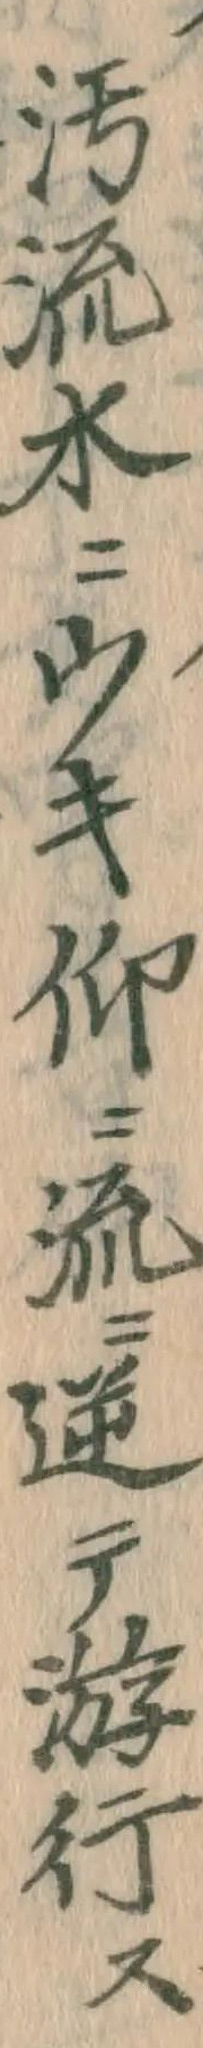汚流水ニウキ仰ニ流ニ逆テ游行ス
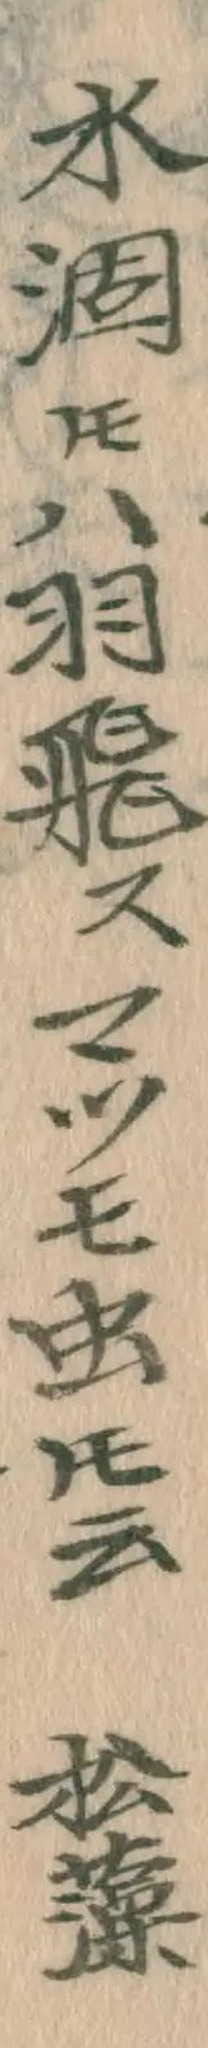水涸トモハ羽飛スマツモ虫トモ云松藻
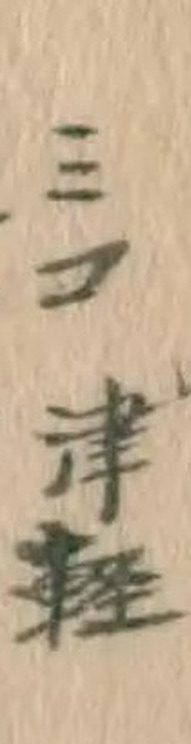ミコ津軽
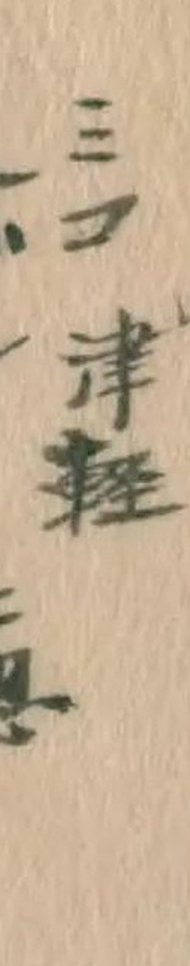ミコ津軽
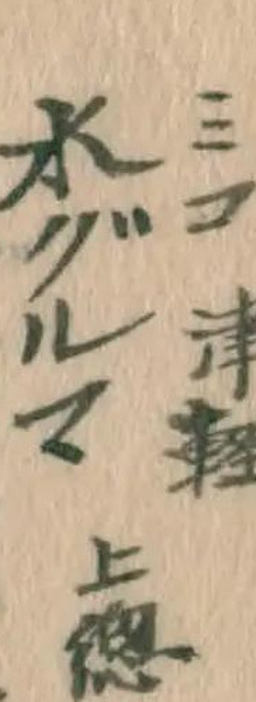水グルマ上總
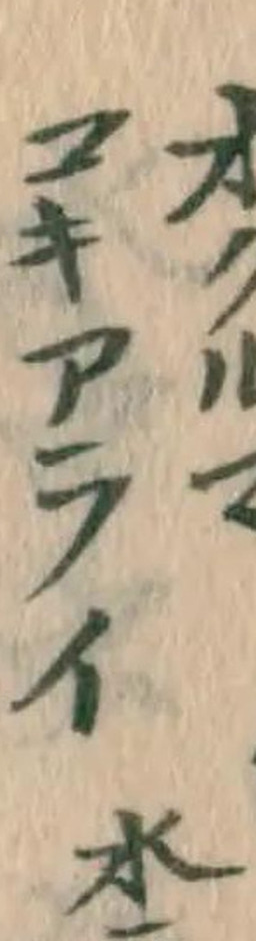コキアライ水戸
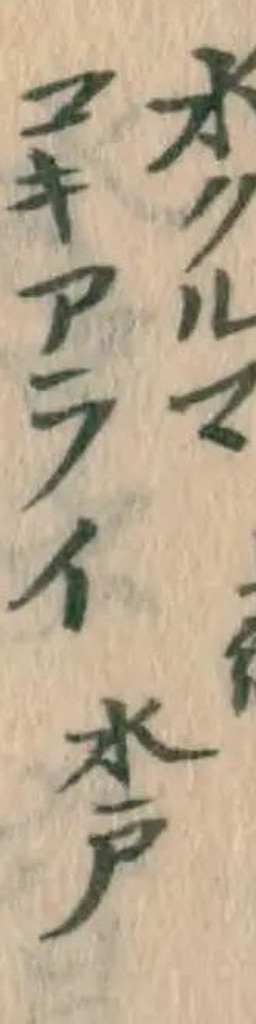コキアライ水戸
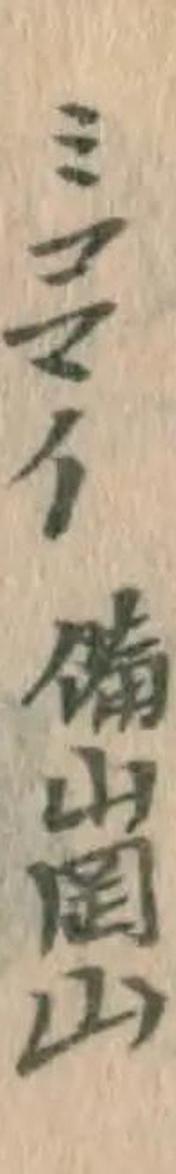ミコマイ備前岡山
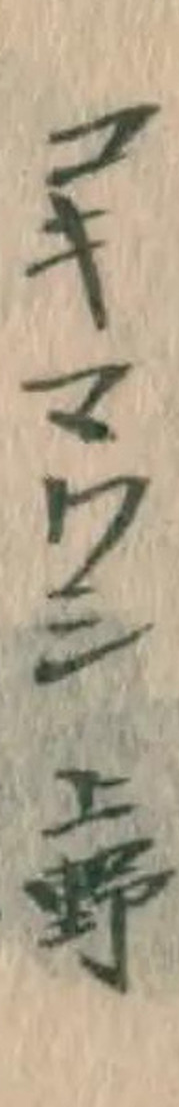コキマワシ上野
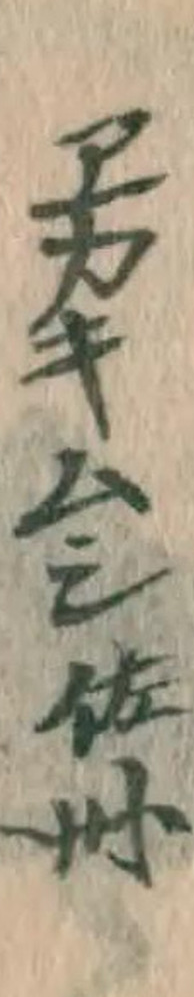ヱカキムシ佐州
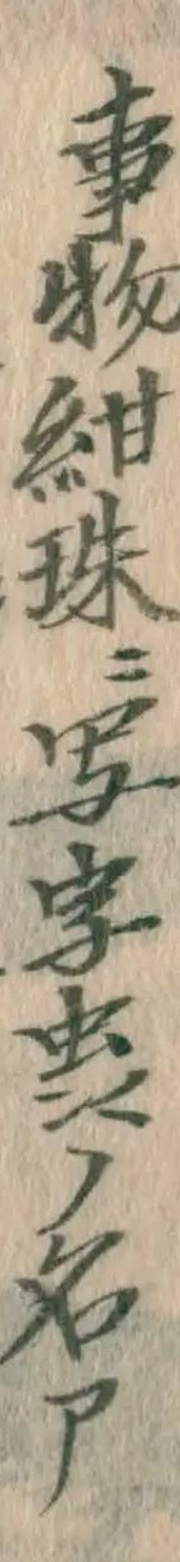事物紺珠ニ写字蟲ノ名ア
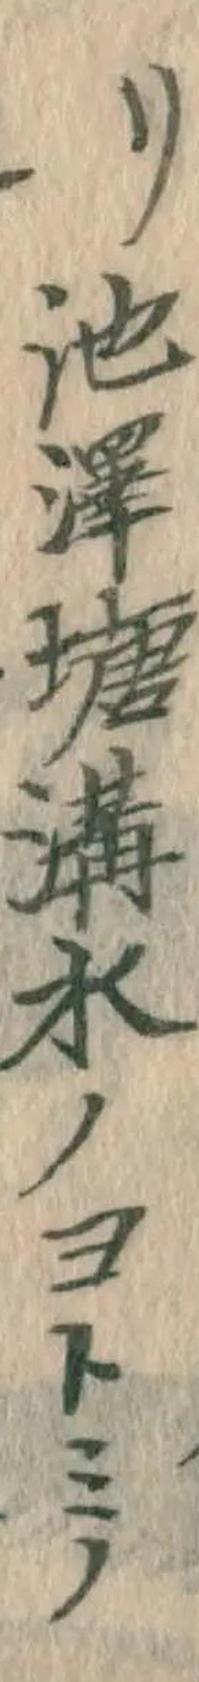リ池澤塘溝水ノヨトミノ
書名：千蟲譜 3巻. [2]
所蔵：国立国会図書館 National Diet Library, JAPAN
